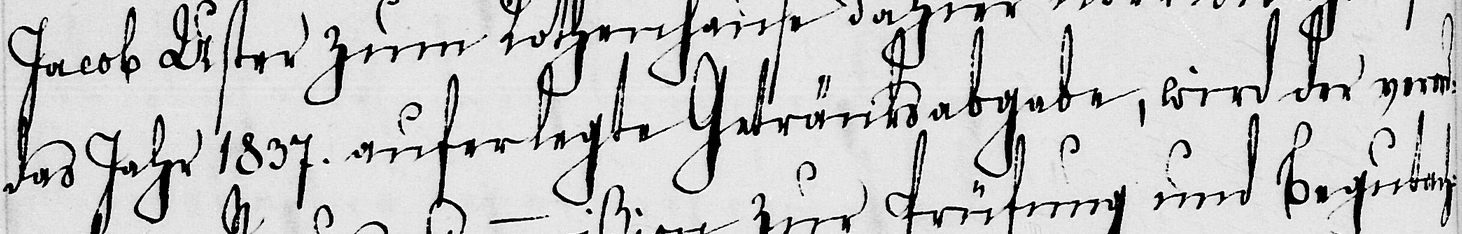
das Jahr 1837. auferlegte Getränksabgabe, wird der ver¬
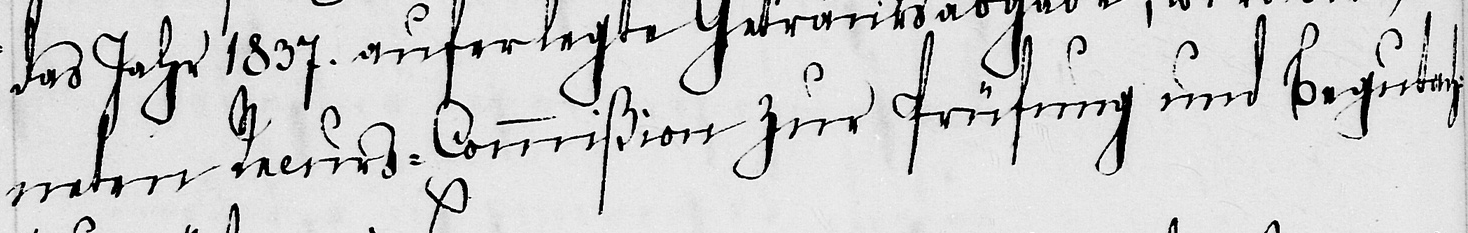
dneten Recurs-Commißion zur Prüfung und Begutac¬
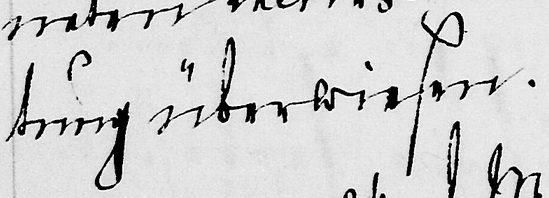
htung überwiesen.
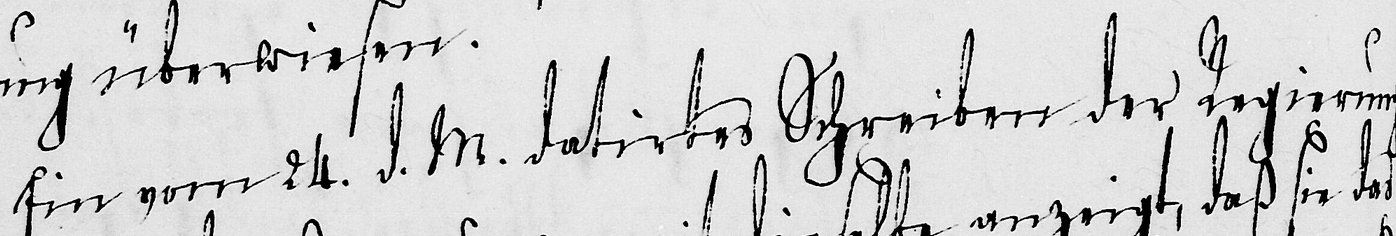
Ein vom 24. d. M. datirtes Schreiben der Regieru¬
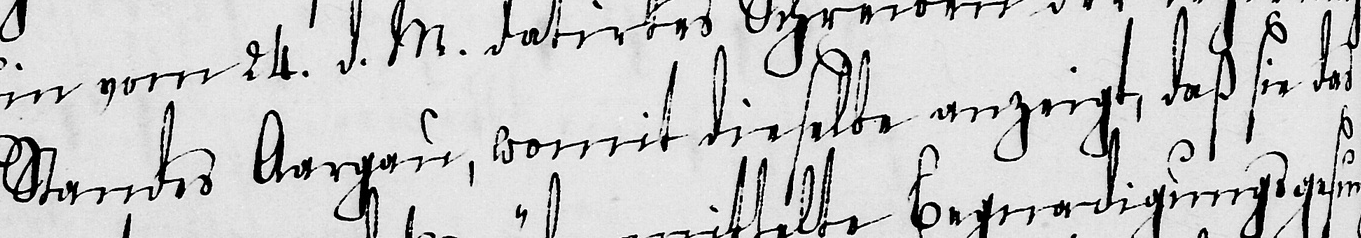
Standes Aargau, womit dieselbe anzeigt, daß sie
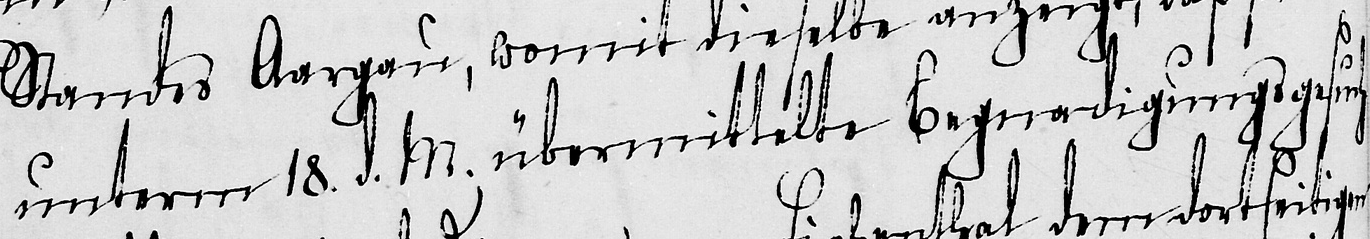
unterm 18. d. M. übermittelte Begnadigungsgesu¬
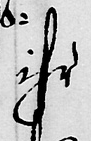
ch
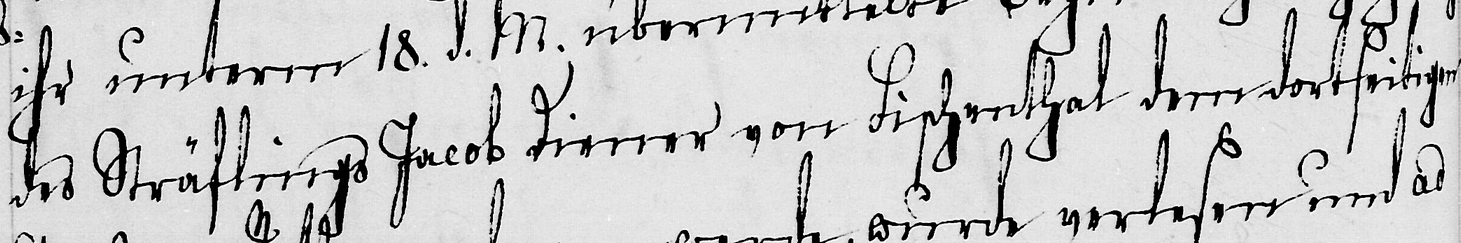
des Sträflings Jacob Diener von Fischenthal dem dortseiti¬
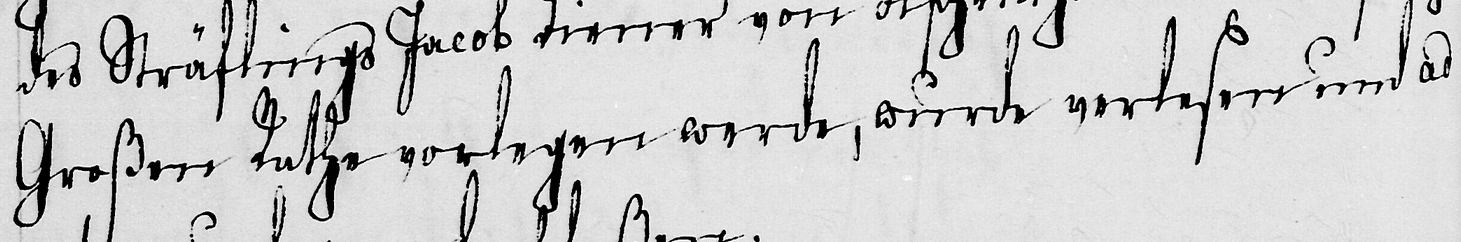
Großen Rathe vorlegen werde, wurde verlesen und ad
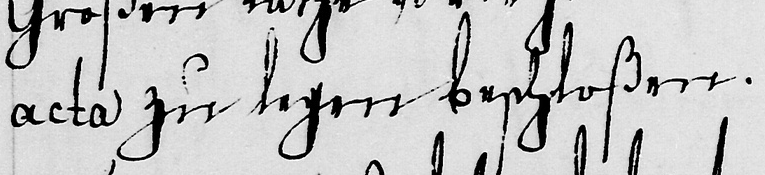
acta zu legen beschloßen.
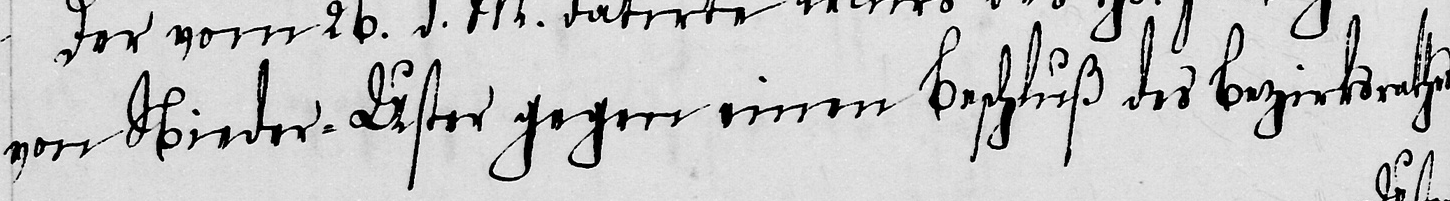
von Nieder-Uster gegen einen Beschluß des Bezirksrath¬
